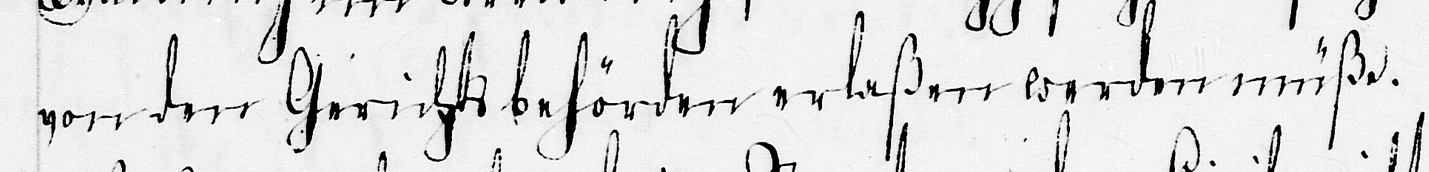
von den Gerichtsbehörden erlaßen werden müße.
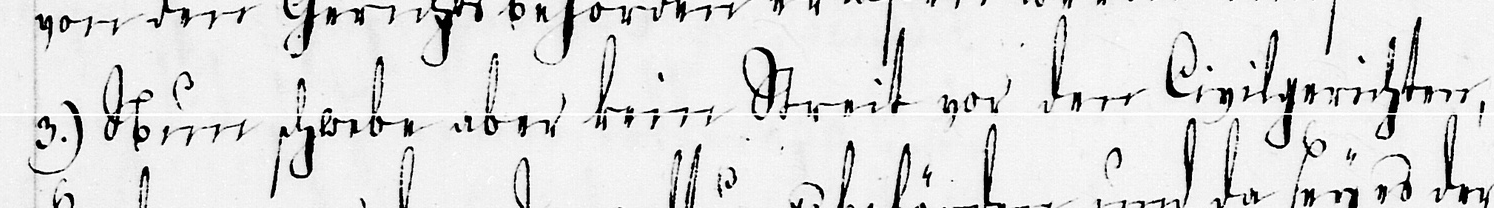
3.) Nun schwebe aber kein Streit vor den Civilgerichten,
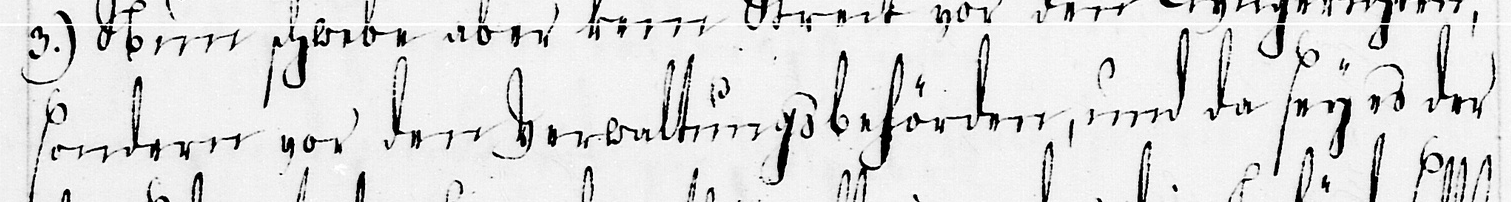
sondern vor den Verwaltungsbehörden, und da sey es der
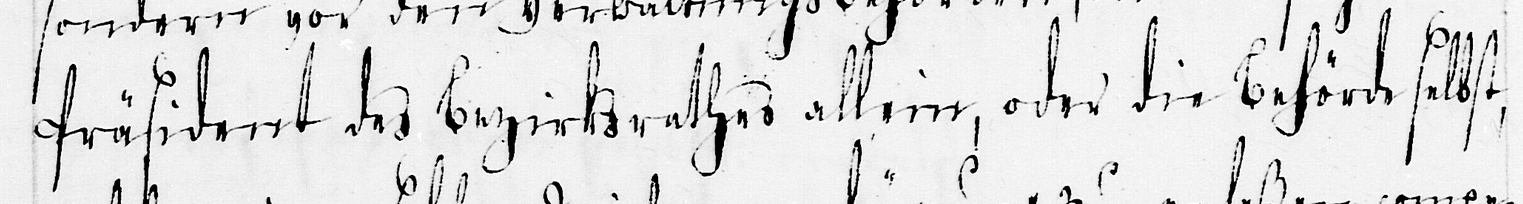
Präsident des Bezirksrathes allein, oder die Behörde sel¬
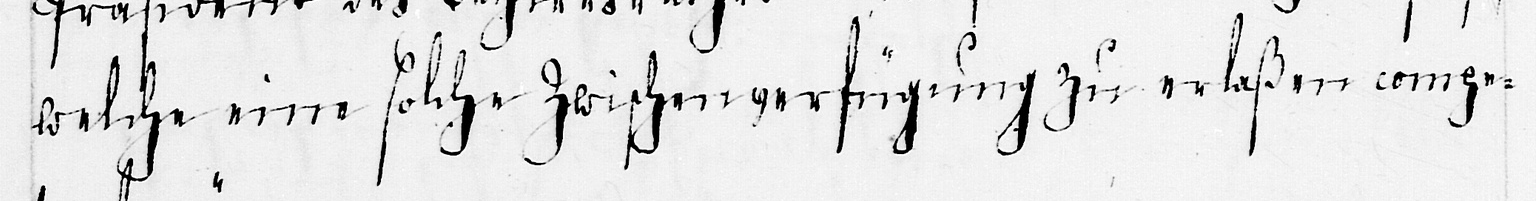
welche eine solche Zwischenverfügung zu erlaßen compe¬
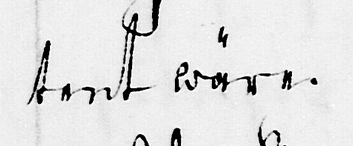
tent wäre.
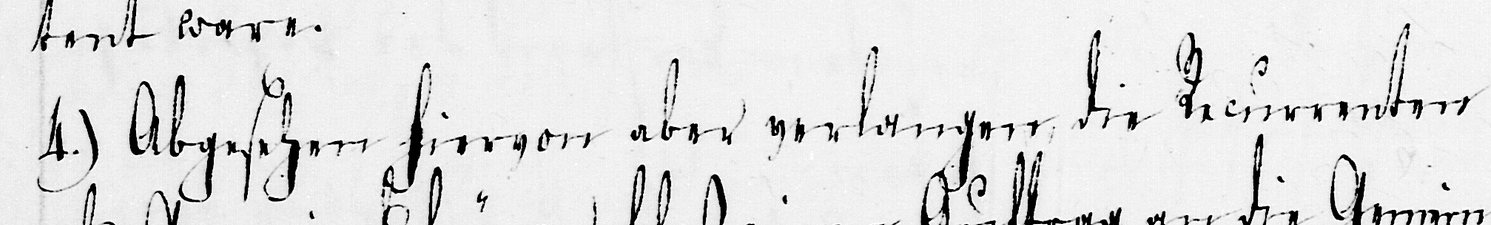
4.) Abgesehen hiervon aber verlangen die Recurrenten
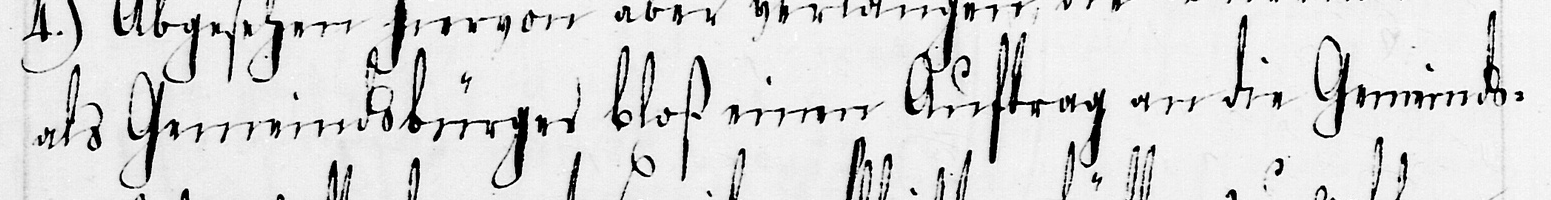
als Gemeindsbürger bloß einen Auftrag an die Gemeinds¬
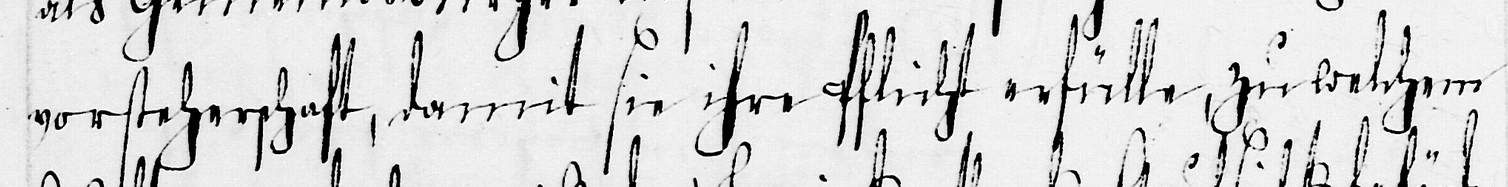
vorsteherschaft, damit sie ihre Pflicht erfülle, zu welchem
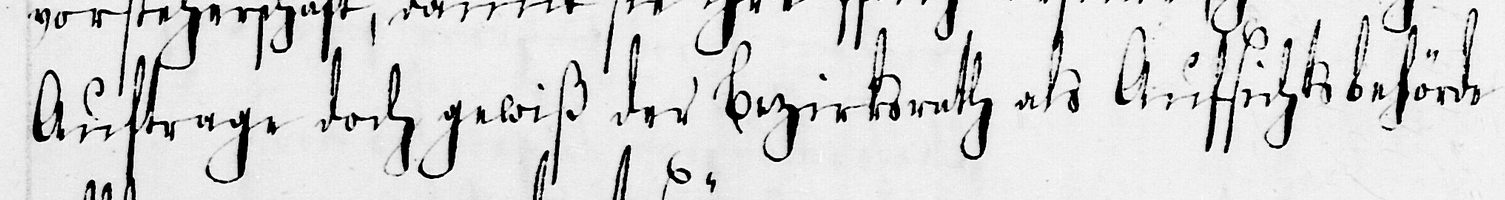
Auftrage doch gewiß der Bezirksrath als Aufsichtsbehörde
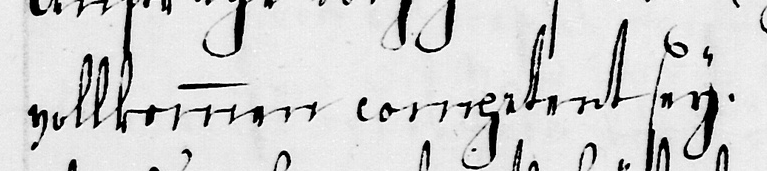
vollkommen competent sey.
